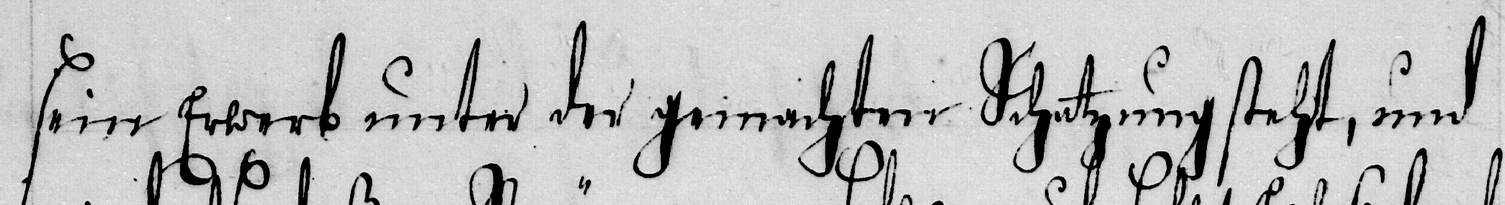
sein Erwerb unter der gemachten Schätzung steht, und
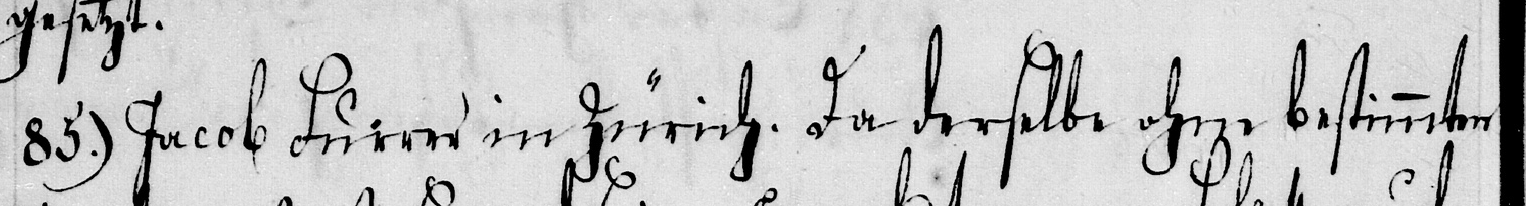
85.) Jacob Furrer in Zürich. Da derselbe ohne bestimmten
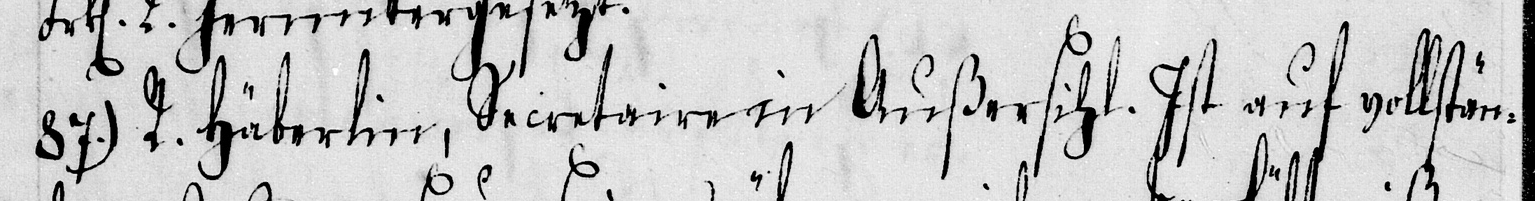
87.) R. Häberlin, Secretaire in Außersihl. Ist auf vollst¬
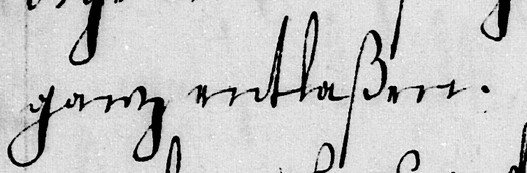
ganz entlaßen.
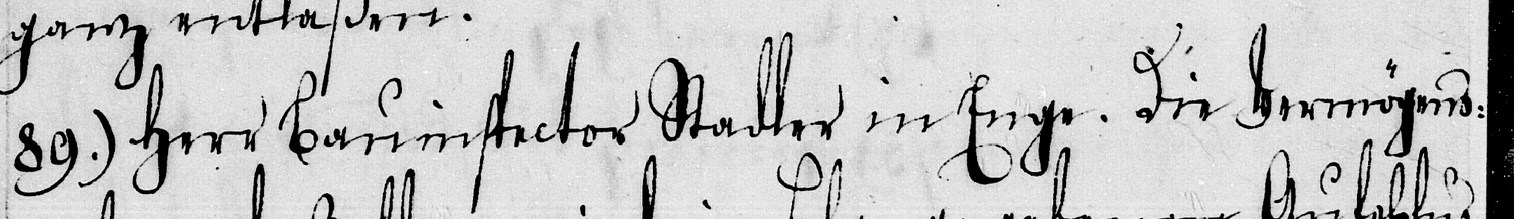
89.) Herr Bauinspector Stadler in Enge. Die Vermögens¬
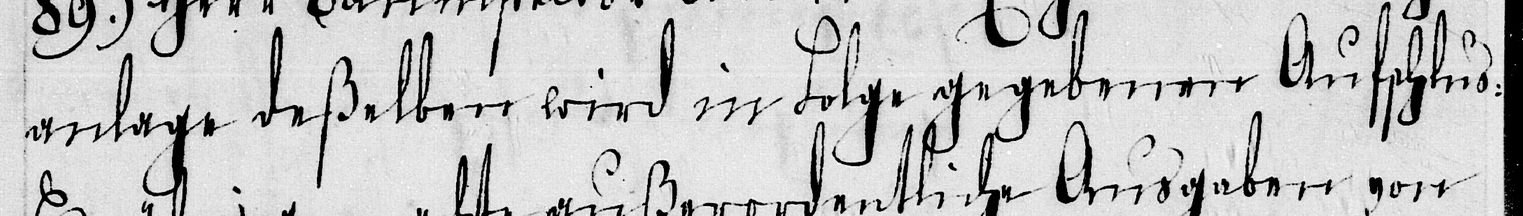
anlage deßelben wird in Folge gegebenen Aufschluß¬
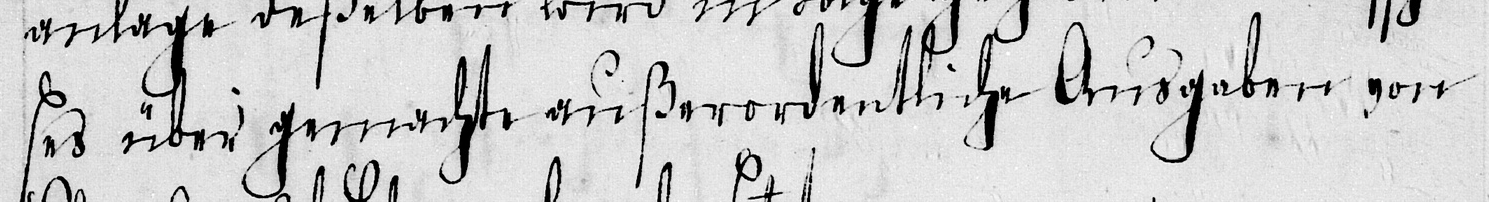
es über gemachte außerordentliche Ausgaben von
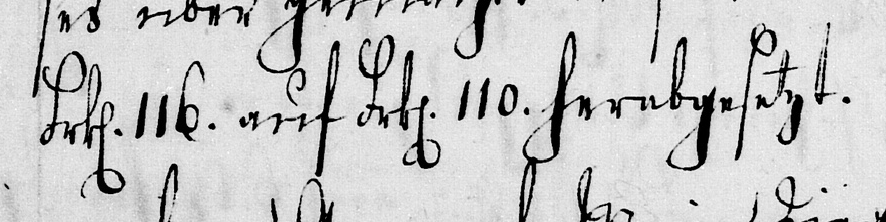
Frk[en]. 170. herabgesetzt.
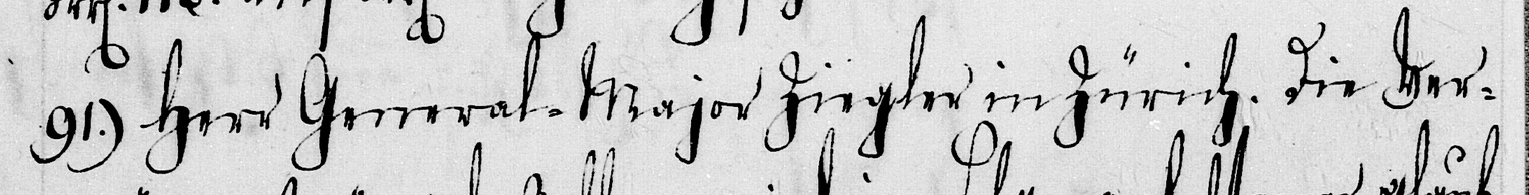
91.) Herr General-Major Ziegler in Zürich. Die Ver¬
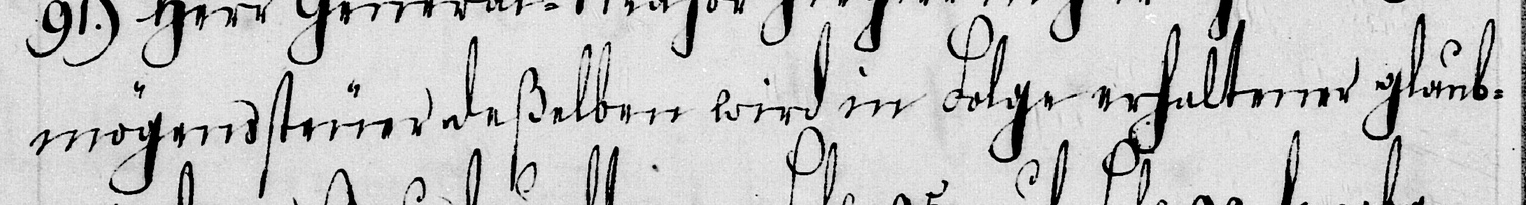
mögenssteuer deßelben wird in Folge erhaltener glaub¬
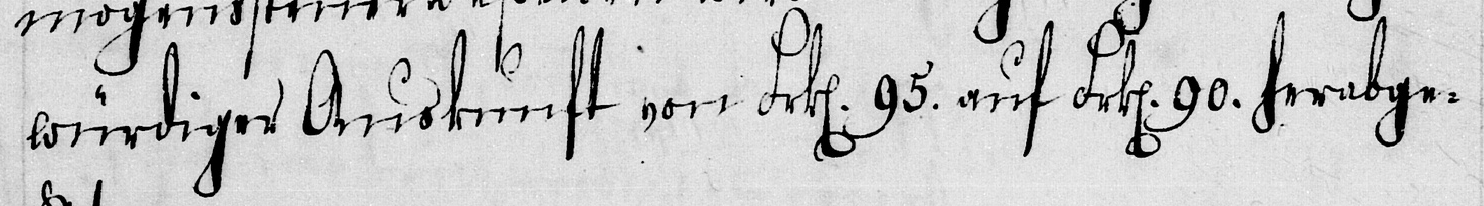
würdiger Auskunft von Frk[en]. 95. auf Frk[e¬
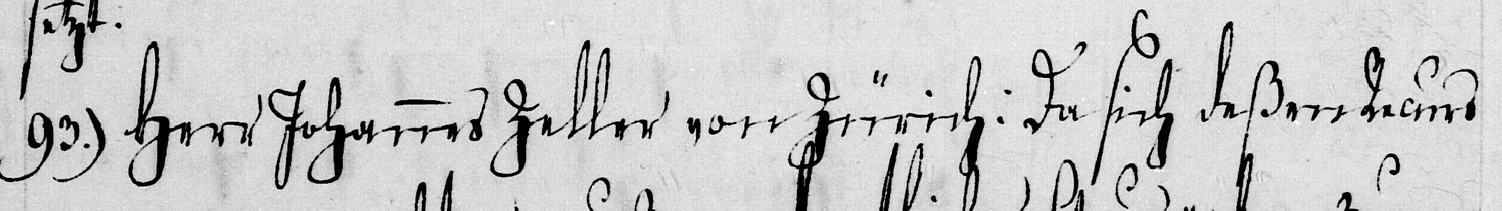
93.) Herr Johannes Zeller von Zürich. Da sich deßen Recurs
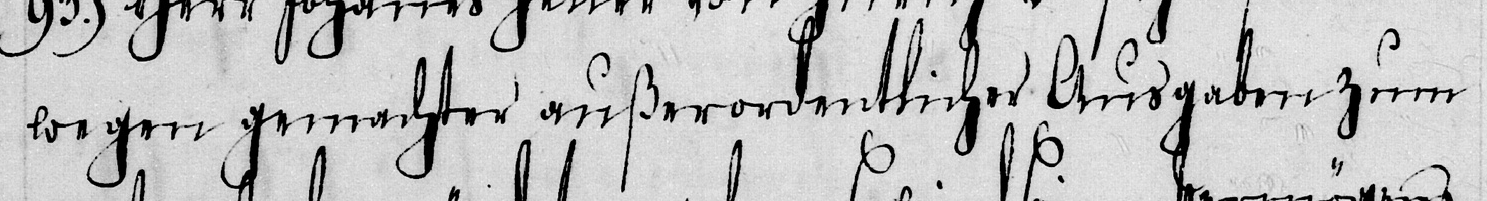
wegen gemachter außerordentlicher Ausgaben zum
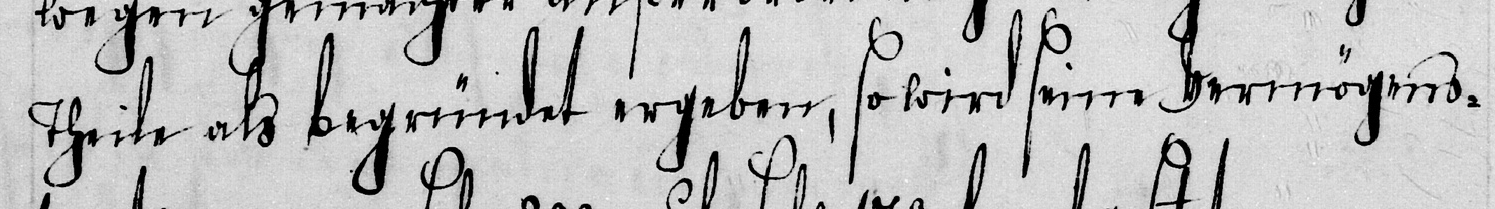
Theile als begründet ergeben, so wird seine Vermögens¬
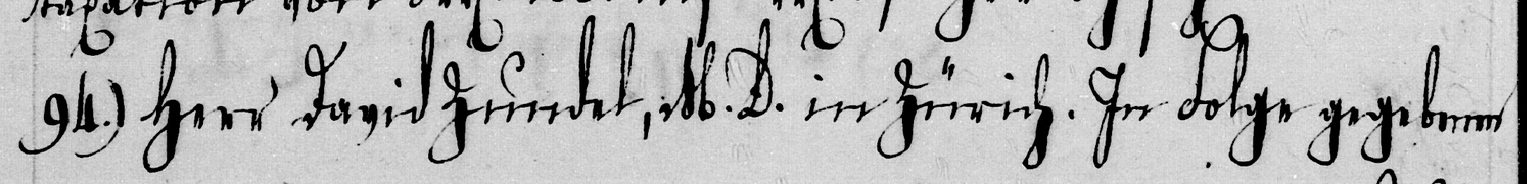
94.) Herr David Zundel, M. D. in Zürich. In Folge gegebenen
